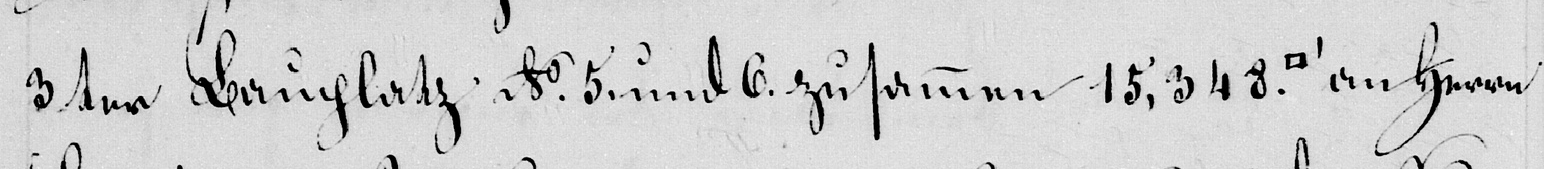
3ter Bauplatz No. 5. und 6. zusammen 15,348 [Quadratfuß] an
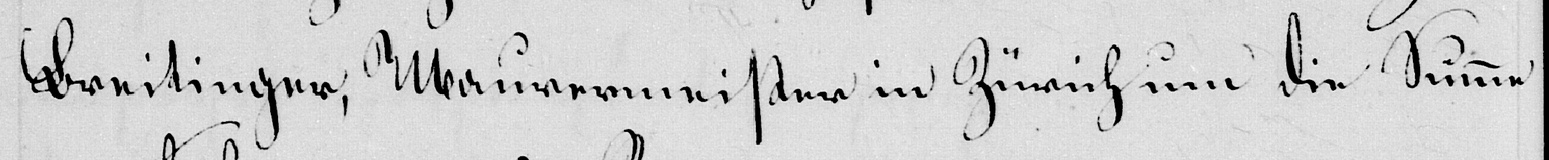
Breitinger, Maurermeister in Zürich um die Summe
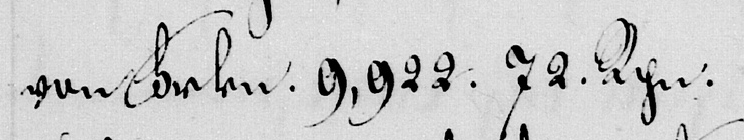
von Frkn. 9,922. 72. Rpn.
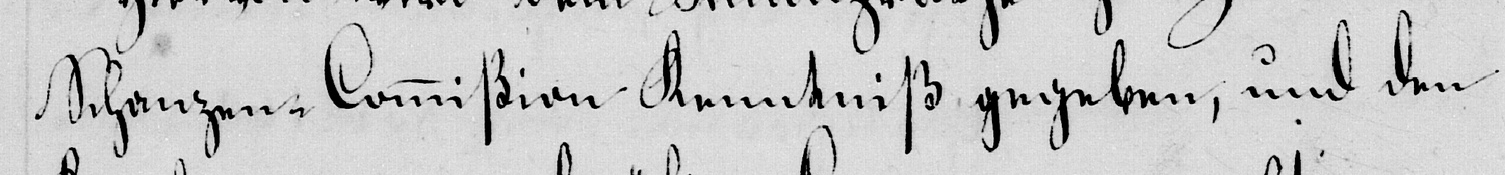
Schanzen-Commißion Kenntniß gegeben, und den
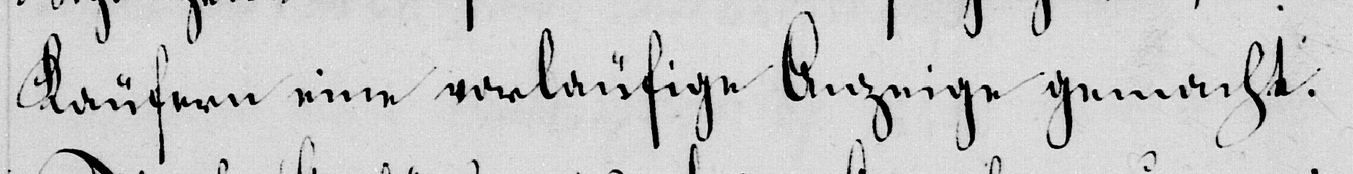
Käufern eine vorläufige Anzeige gemacht.
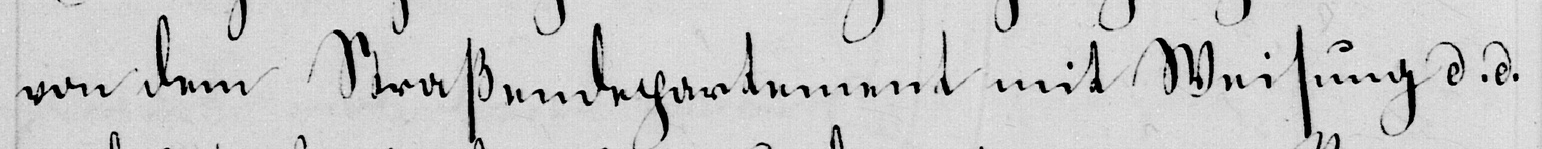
von dem Straßendepartement mit Weisung d. d.
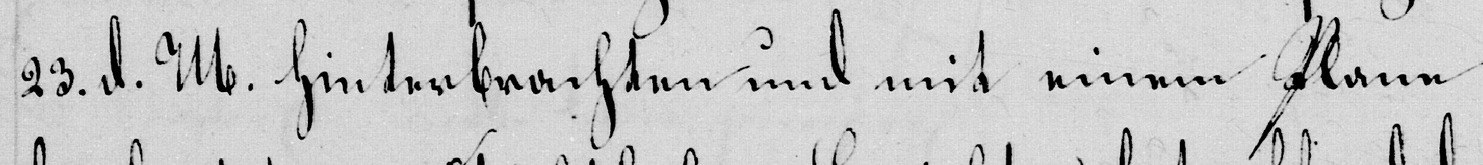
23. d. M. hinterbrachten und mit einem Plane
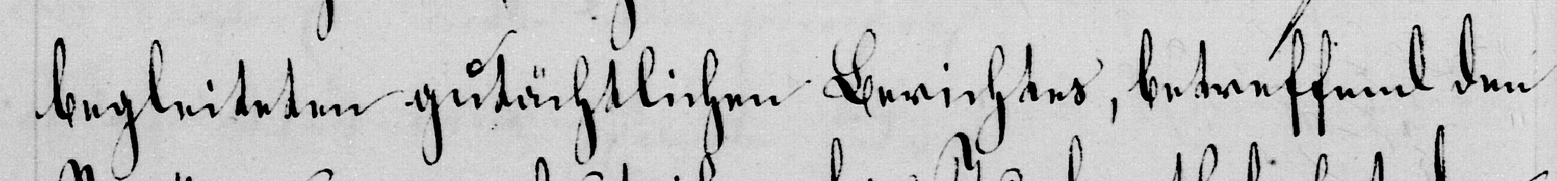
begleiteten gutächtlichen Berichtes, betreffend den
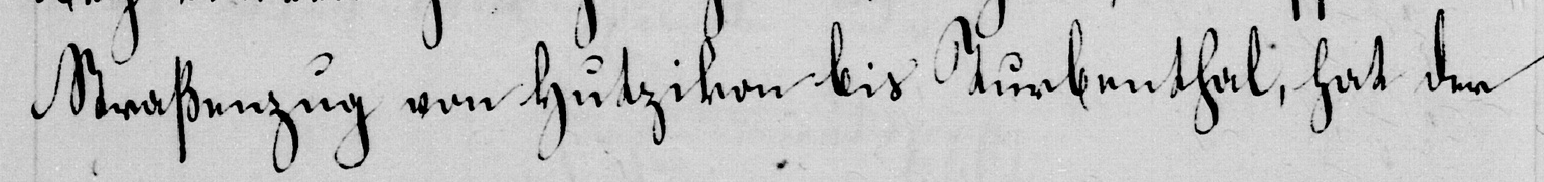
Straßenzug von Hutzikon bis Turbenthal, hat der
